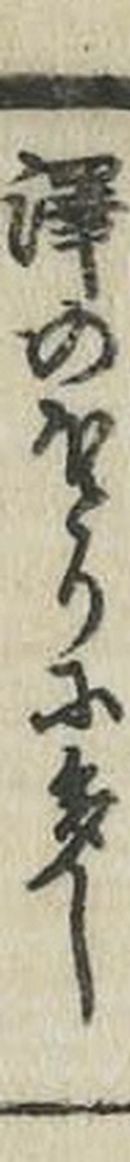沢のほとりに多し

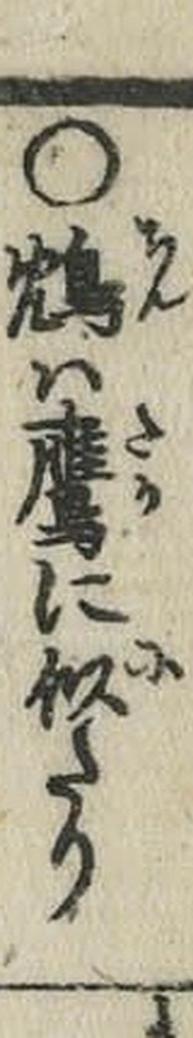○鴆は鷹に似たり
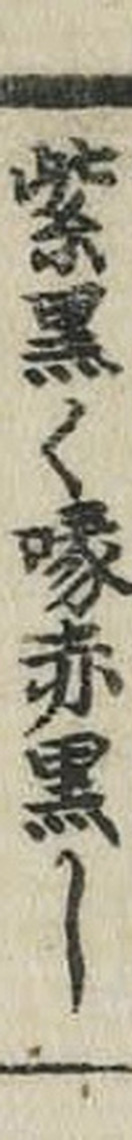紫黒く喙赤黒し
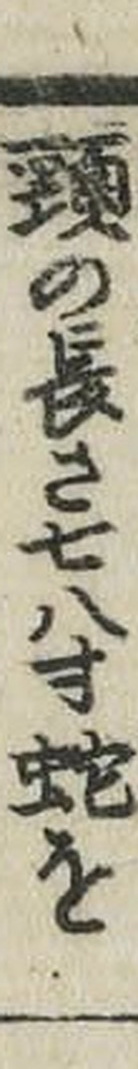頸の長さ七八寸蛇を
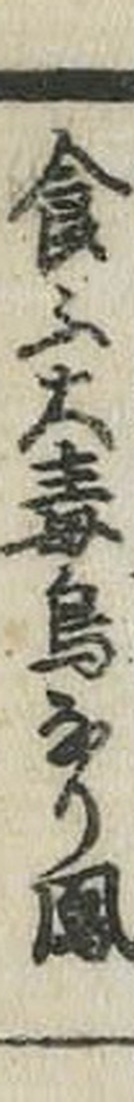食ふ大毒鳥なり鳳
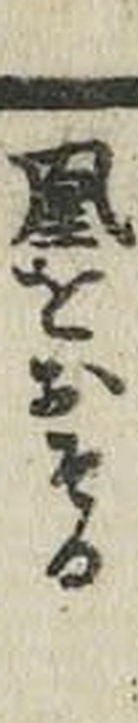凰をおそる
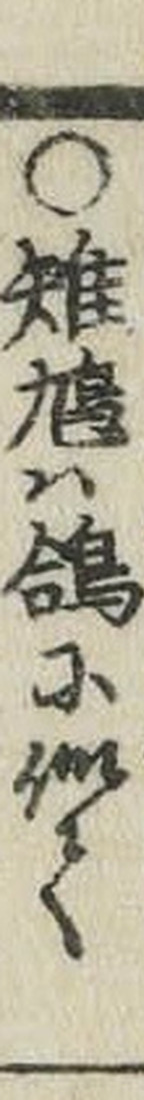○雉鳩は鴿に似て
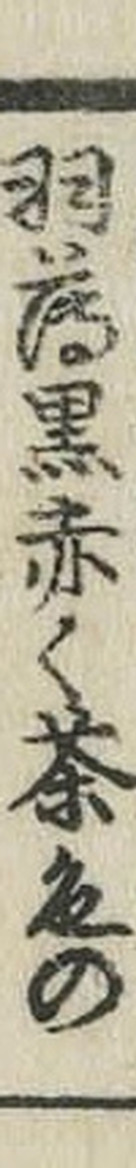羽薄黒赤く茶色の
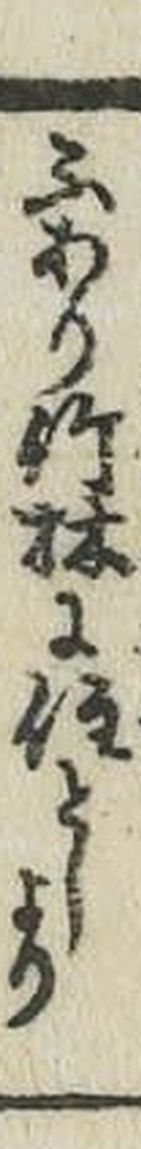ふあり竹林に住としより
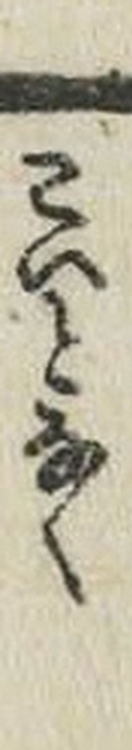こいとなく
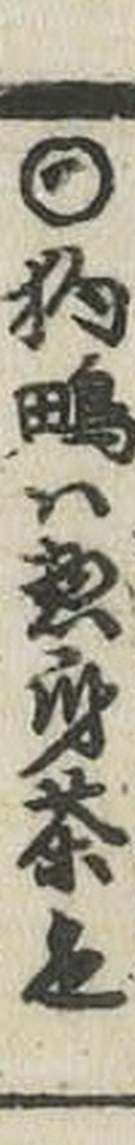○犳鴫は惣身茶色
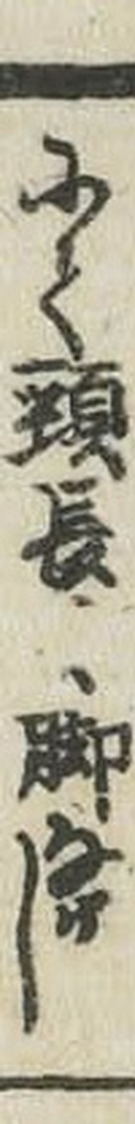にて頸長く脚ながし
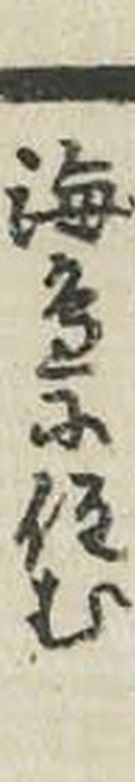海辺に住む
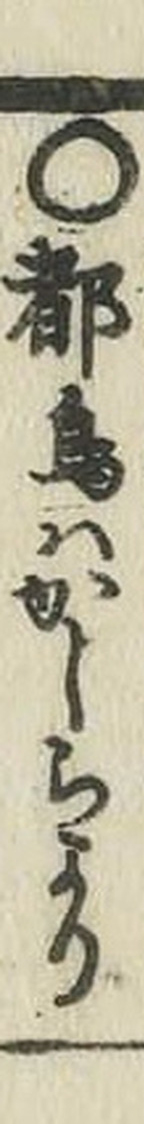○都鳥はかしらより
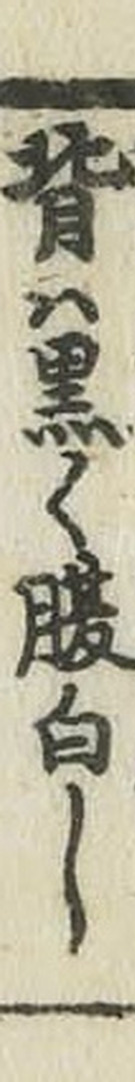背は黒く腹白し
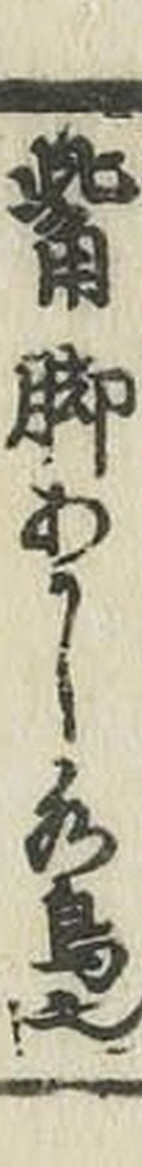觜脚あかし水鳥也
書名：増補頭書訓蒙図彙大成 10巻 6:巻之12-13
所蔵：東京学芸大学教育コンテンツアーカイブ
